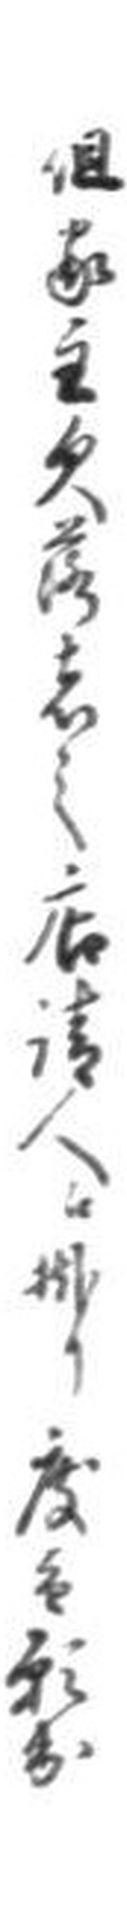但家主欠落者之店請人江掛り度旨願出
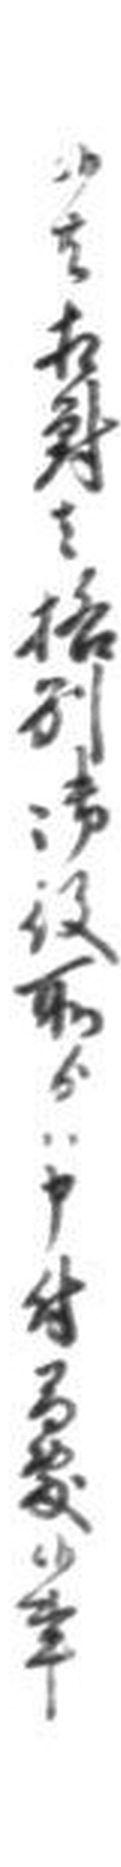候共相対者格別御役所ゟハ申付間敷候事
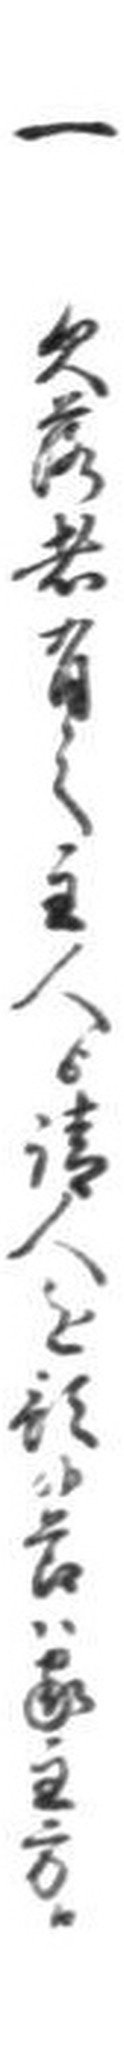一欠落者有之主人ゟ請人を預候節ハ家主方江

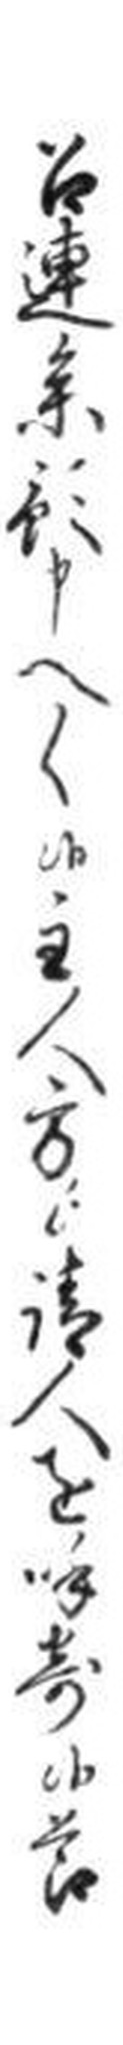召連参預申べく候主人方も請人を呼寄候節
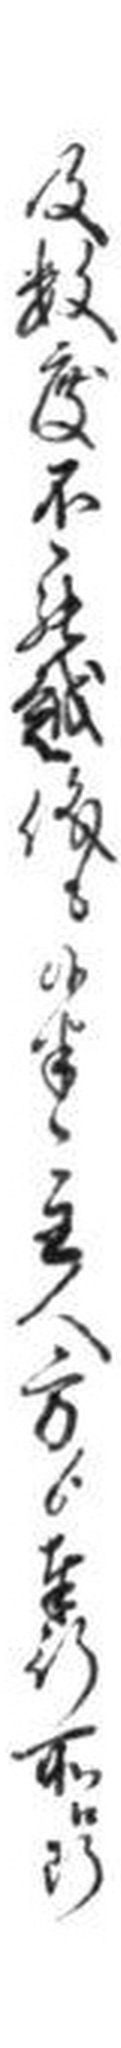及数度不罷越儀も候半候主人方ゟ奉行所江断
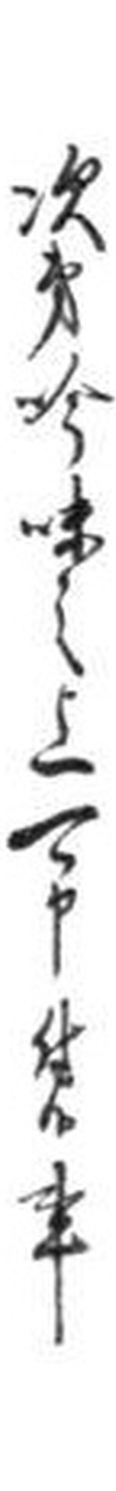次第吟味之上可申付候事
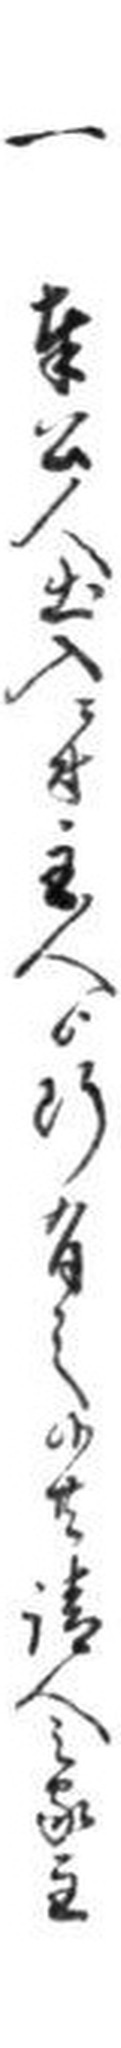一奉公人出入ニ付主人ゟ断有之候共請人之家主
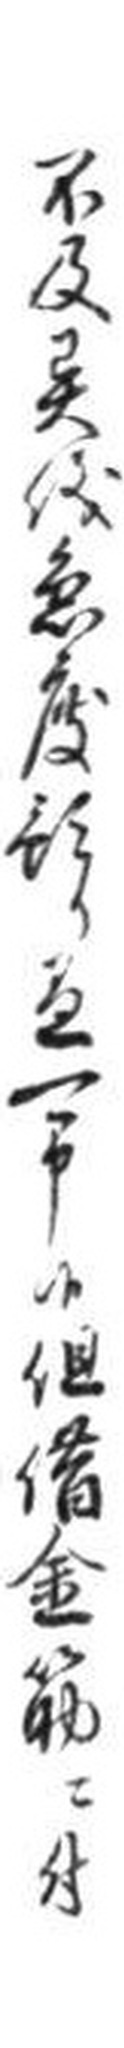不及異儀急度預り置可申候但借金筋ニ付
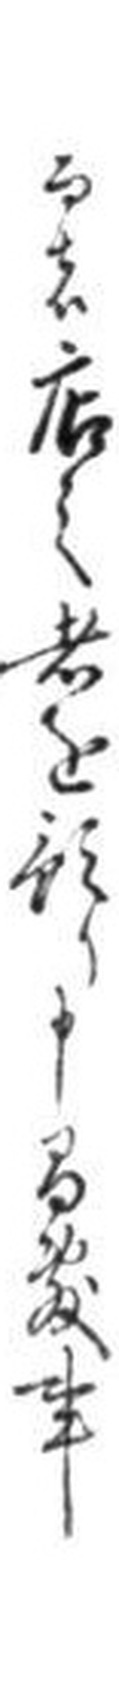而者店之者を預り申間敷事
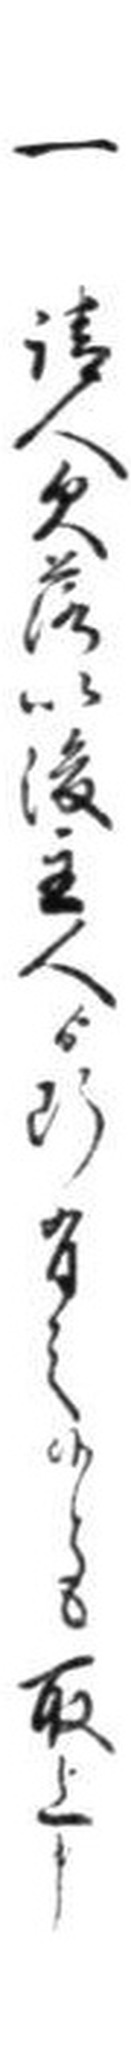一請人欠落以後主人ゟ断有之候とも取上申
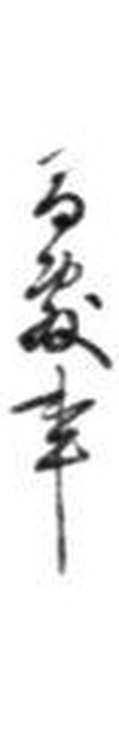間敷事
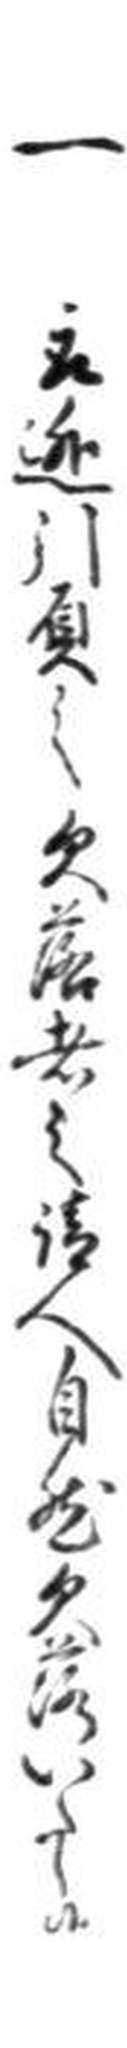一取逃引負之欠落者之請人自然欠落いたし候
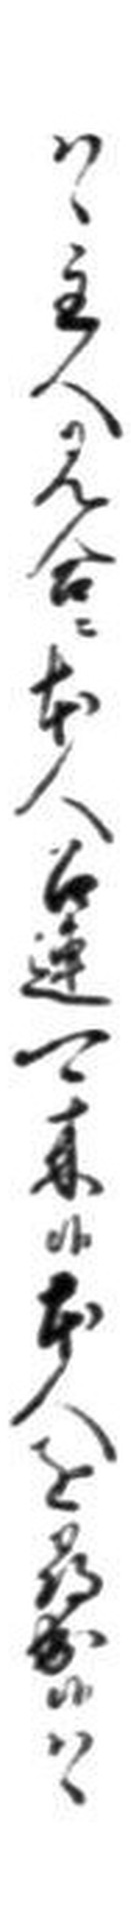ハヽ主人見合ニ本人召連可来候本人を尋出候ハヽ
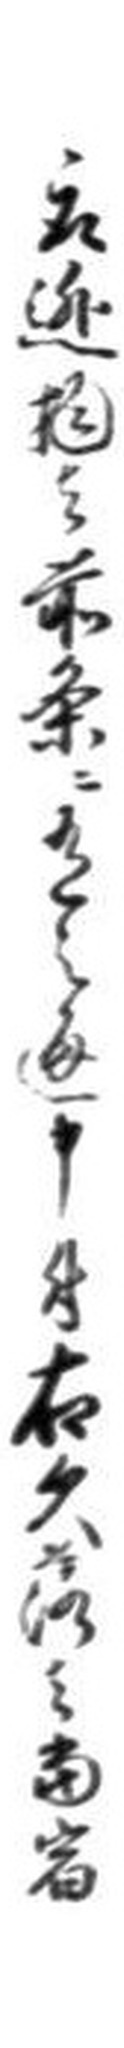取逃物者前条ニ有之通申付右欠落者当宿
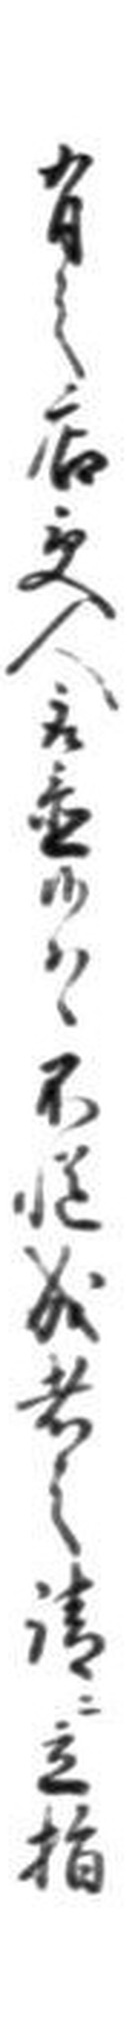有之店受人取置候ハヽ不慥成者之請ニ立指
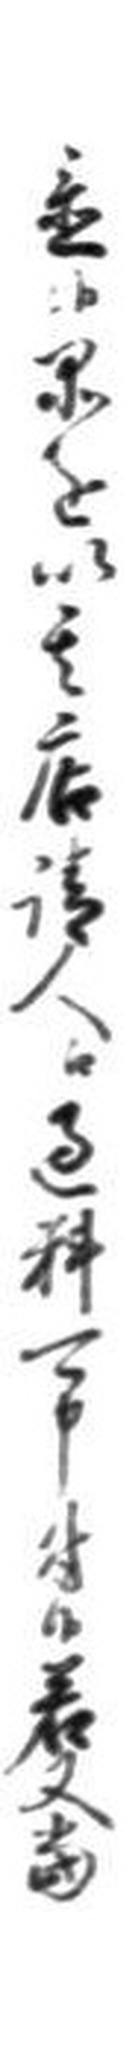置候品を以其店請人江過料可申付候若又当
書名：家譜 三十三 吉邦公 享保四年
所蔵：福井県文書館 Fukui Prefectural Archives
